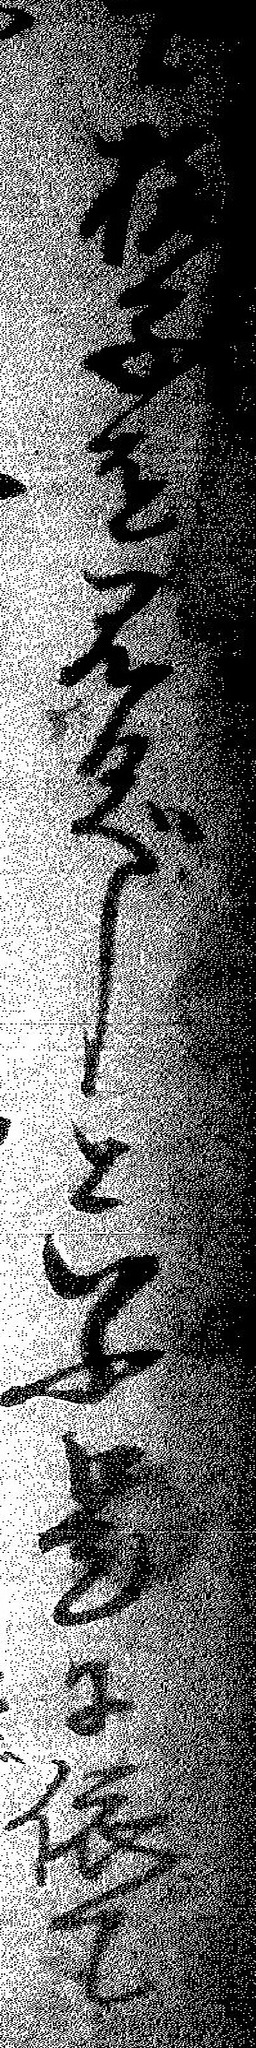て様子を見るべしといふ是にｙ依て
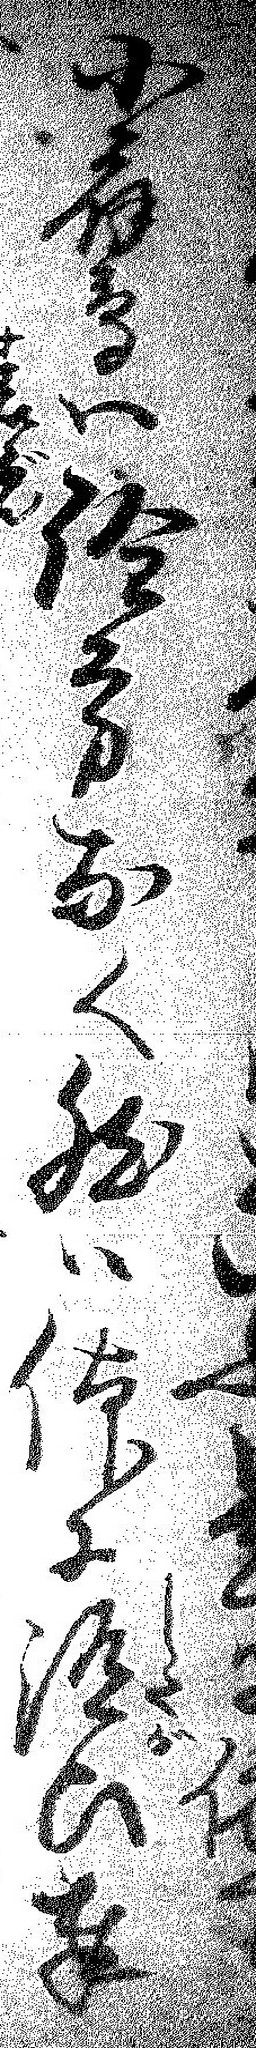小鷹は詮方なく然は仰に随ひ奉
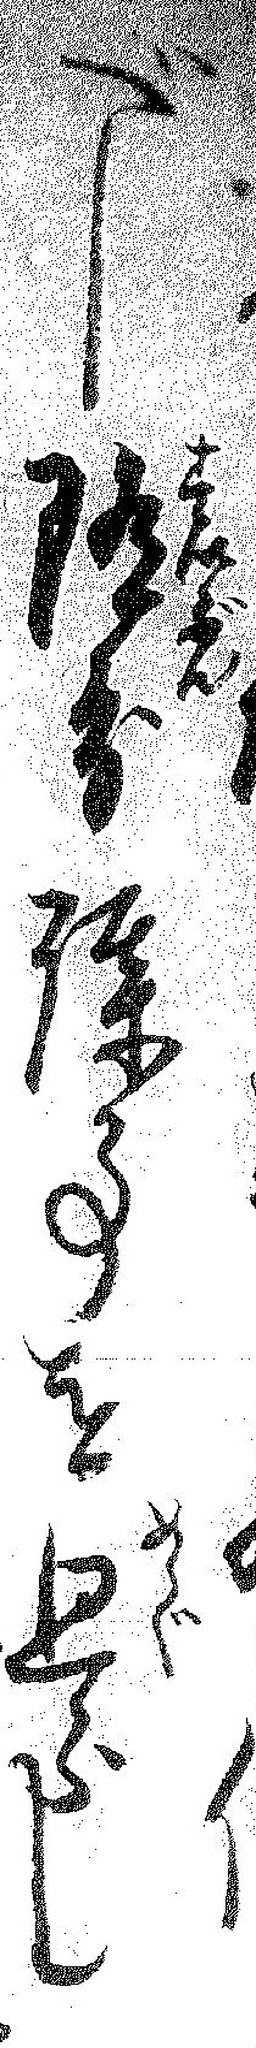べし随分謀事を廻らし
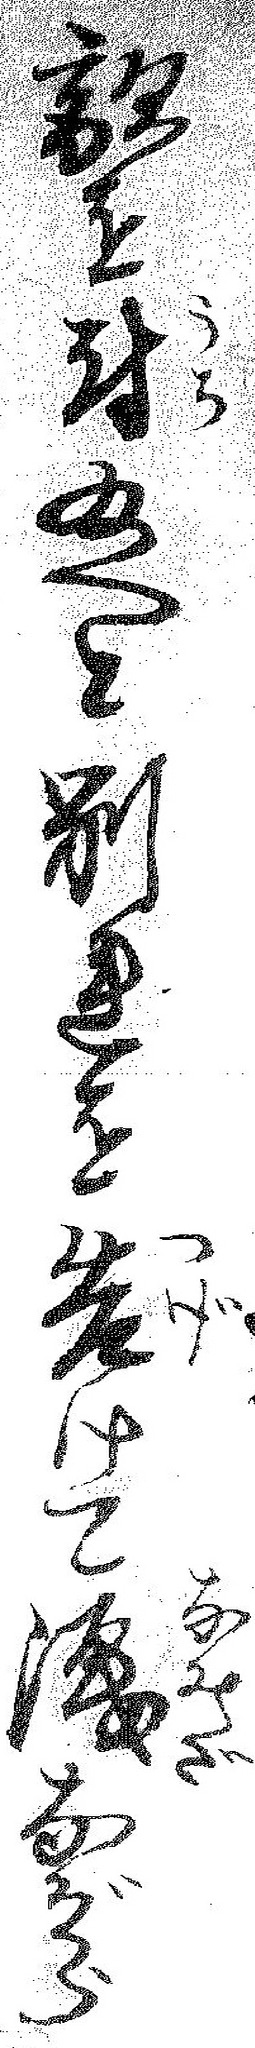敵を討給へと別れを告けて涙ながら
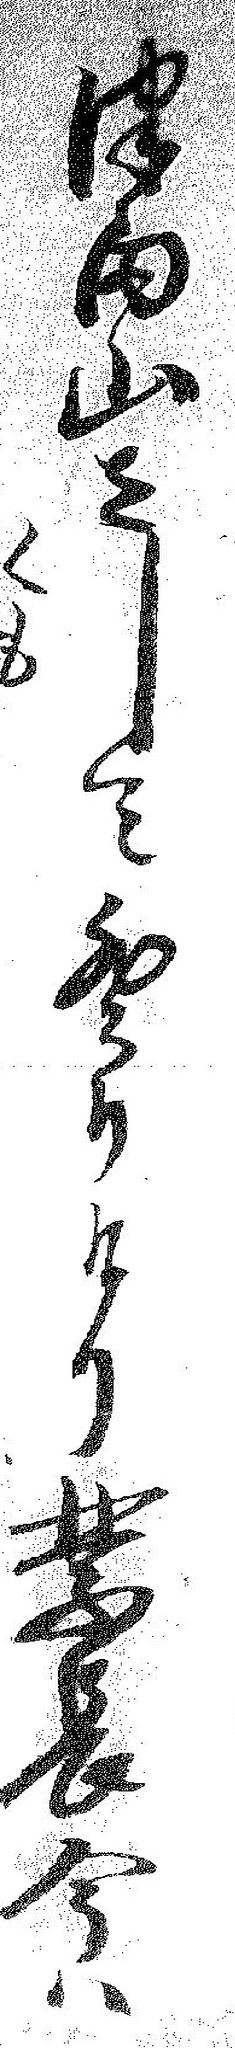津田山さして登りけり禁長今は
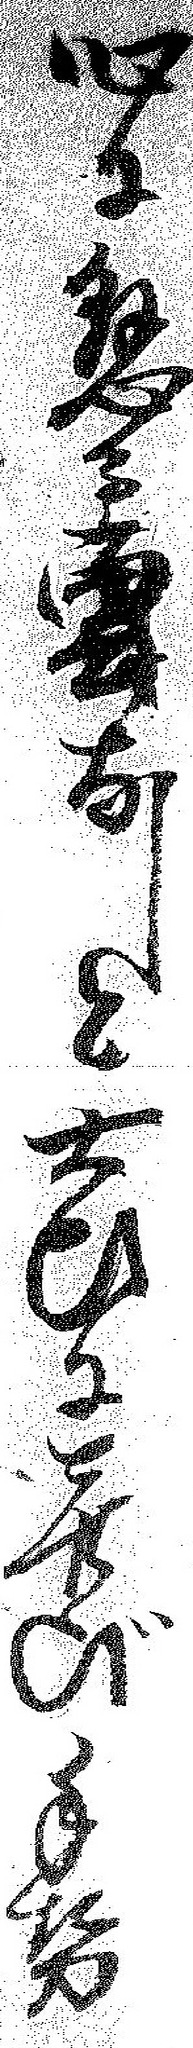心に懸る雲なしと大ひに喜び手勢
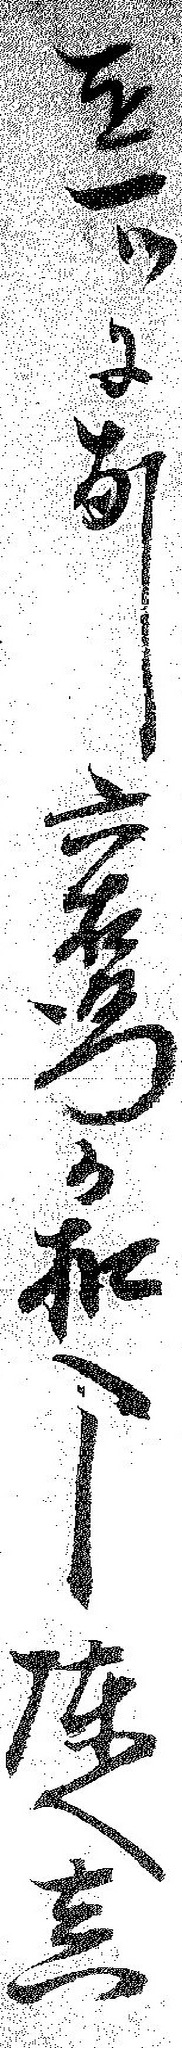を一ツになし六右衛門か控へし陣へ真
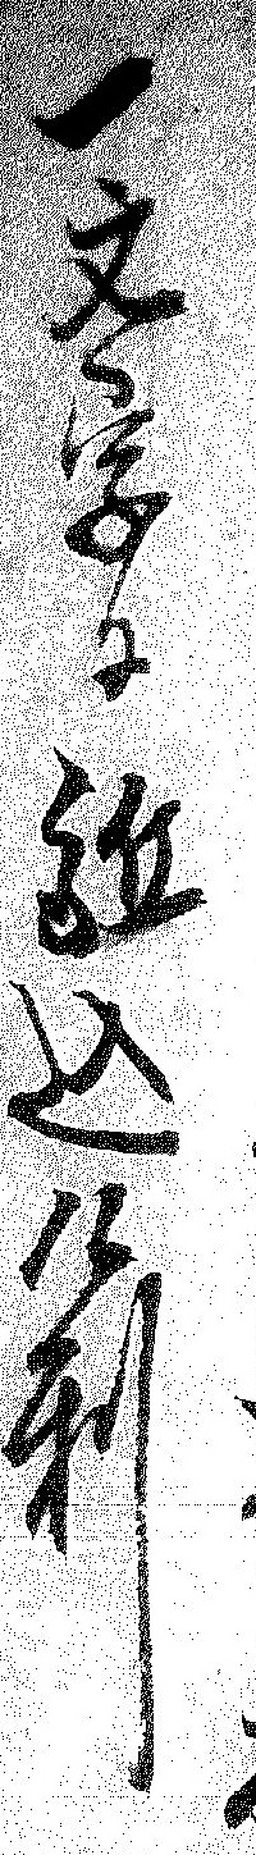一文字に駆込けり
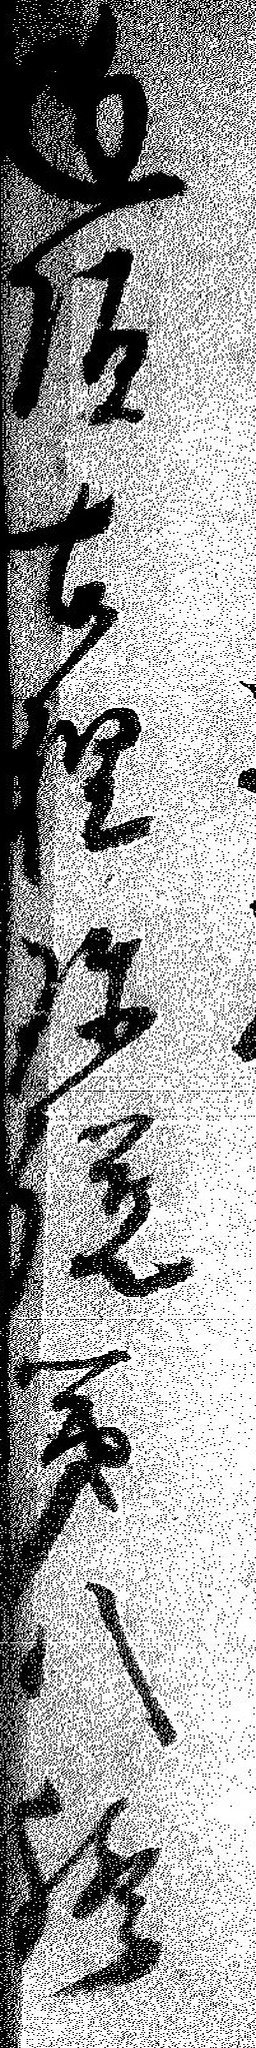近頃古狸珍説第八終
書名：近頃古狸珍説　礼義智信
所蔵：徳島県立図書館
